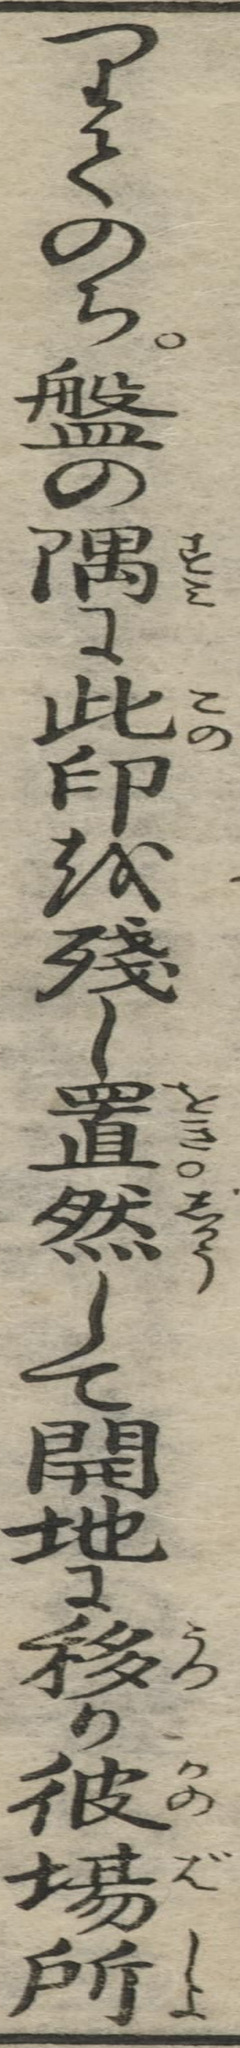りてのち。盤の隅に此印を残し置。然して開地に移り彼場所
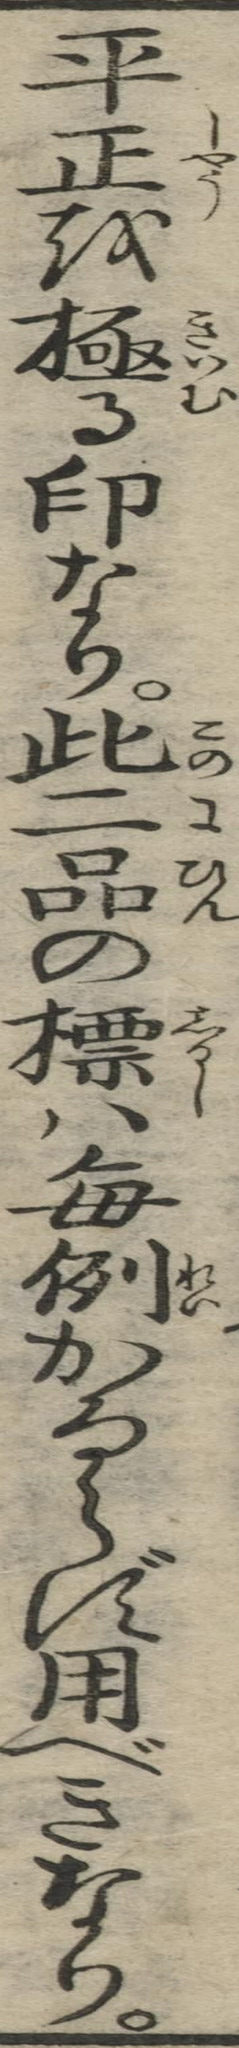平正を極る印なり。此二品の標は毎例かならず用べきなり。
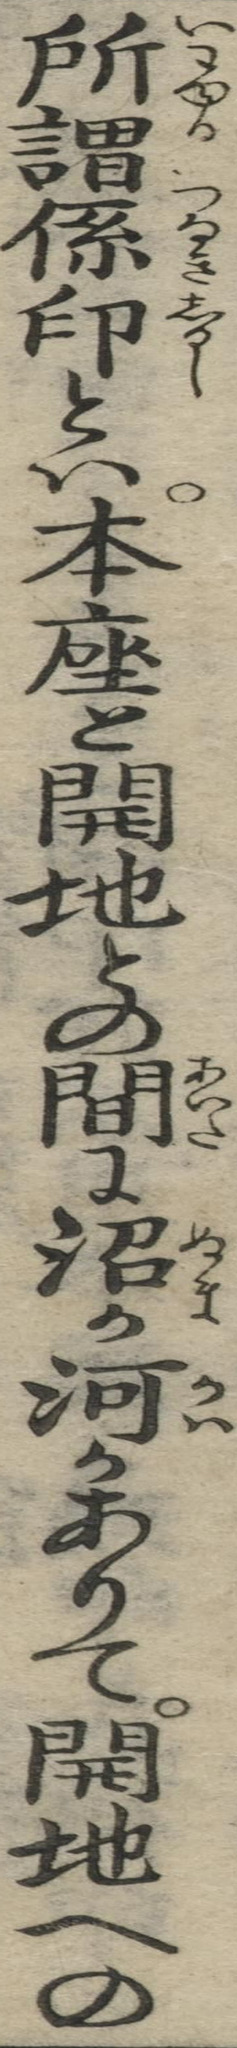所謂係印とは。本座と開地との間に沼か河かありて。開地への

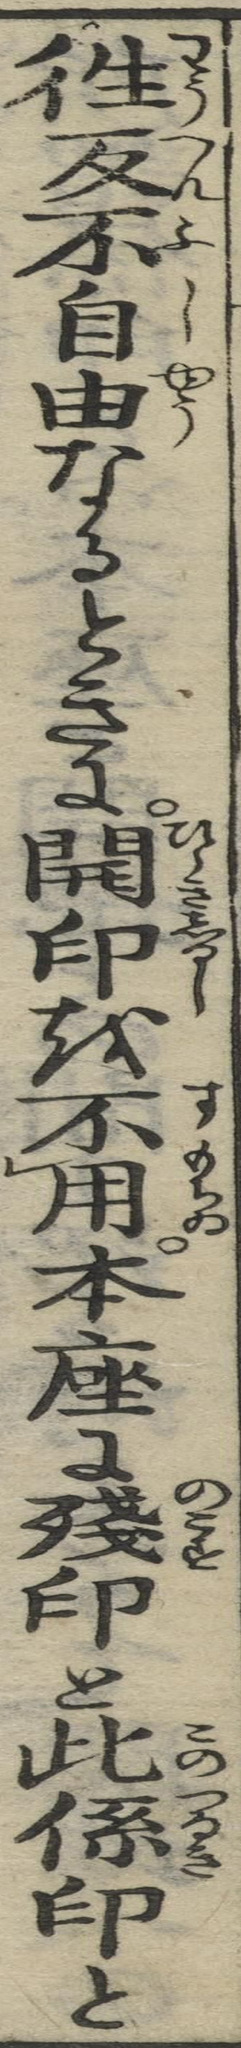往反不自由なるときに。開印を不用。残印と此係印と
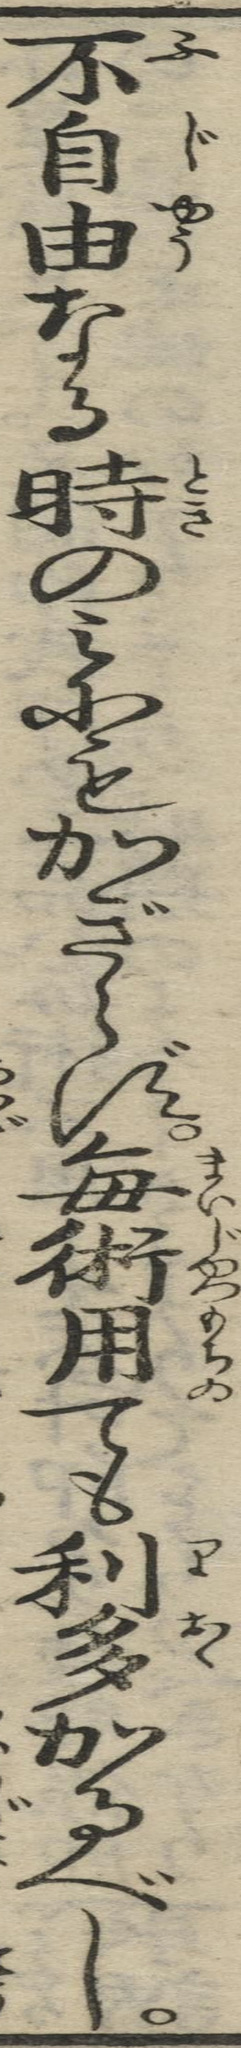不自由なる時のみにとかぎらず。毎術用ても利多かるべし。
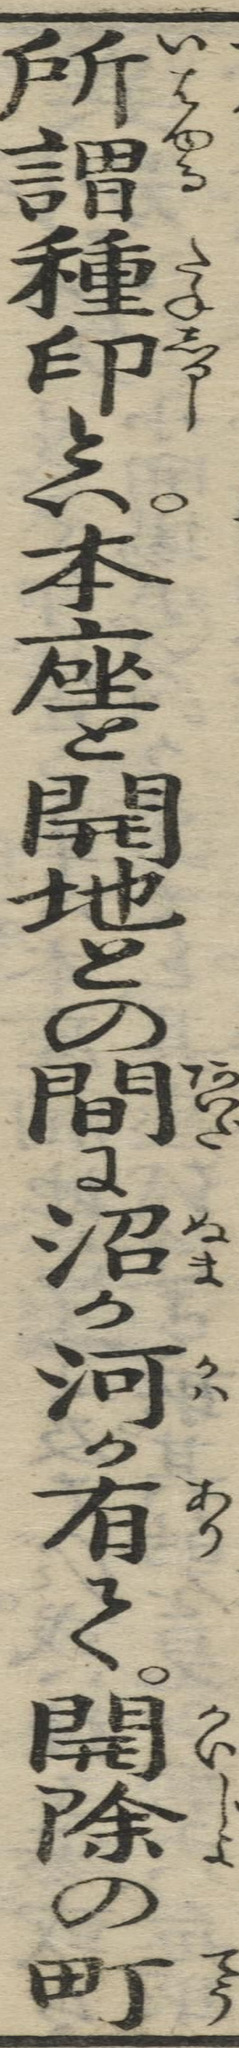所謂種印とは。本座と開地との間に沼か河か有て。開除の町
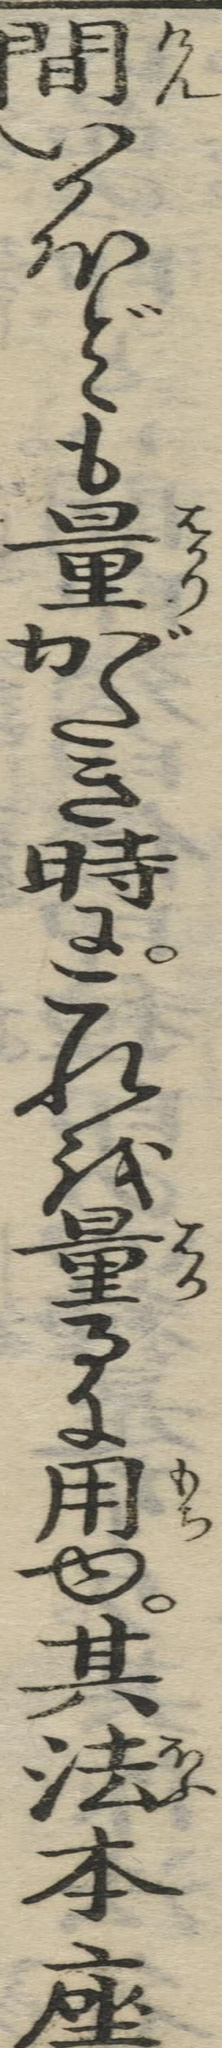間いかほどゝも量がたき時に。これを量るに用や。其法本座
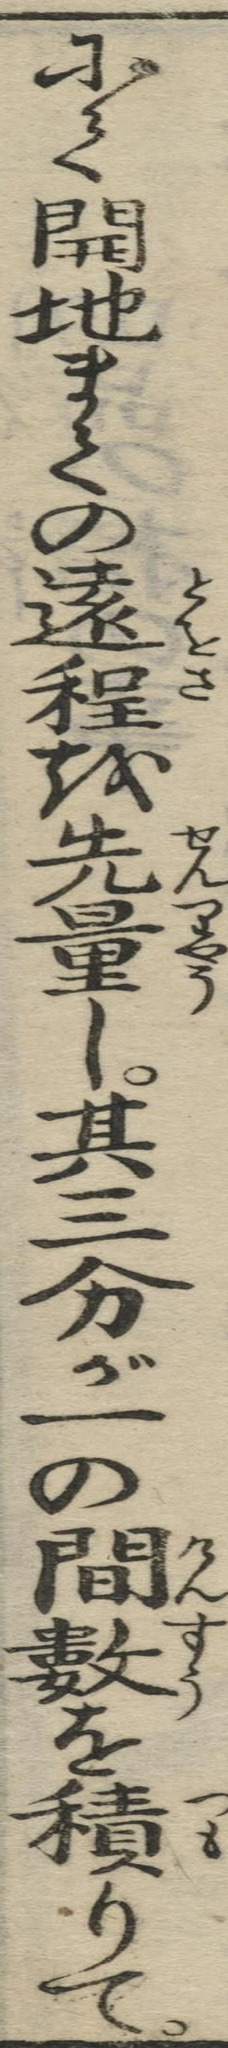にて開地まての遠程を先量し。其三分が一の間数を積りて。
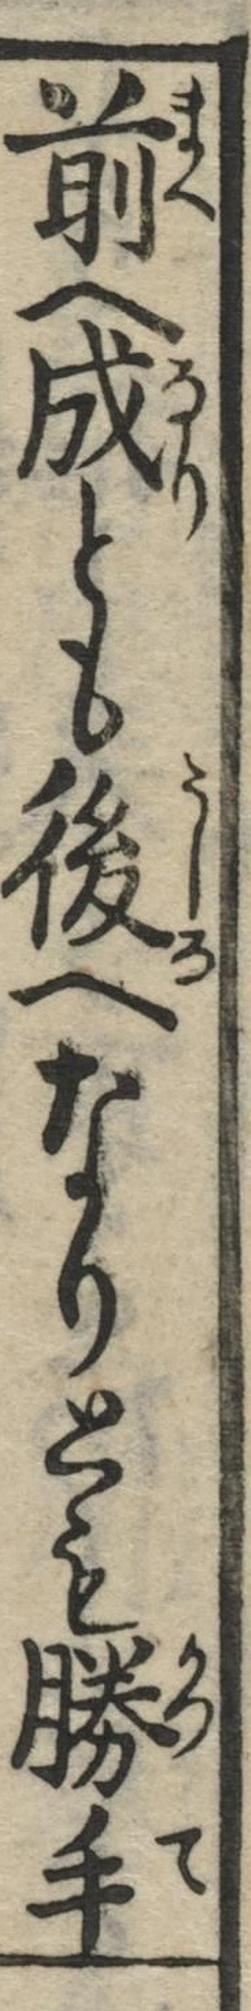前へ成とも後へなりとも勝手
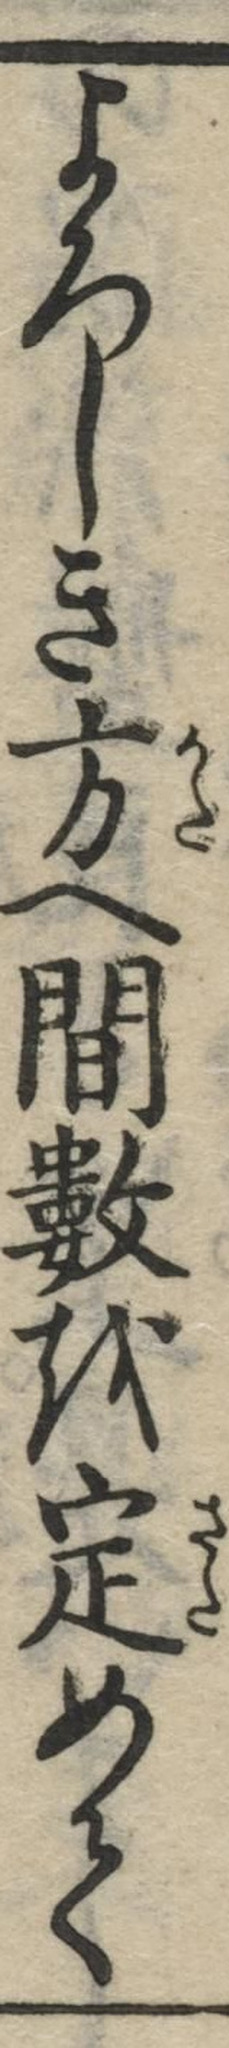よろしき方へ間数を定めて
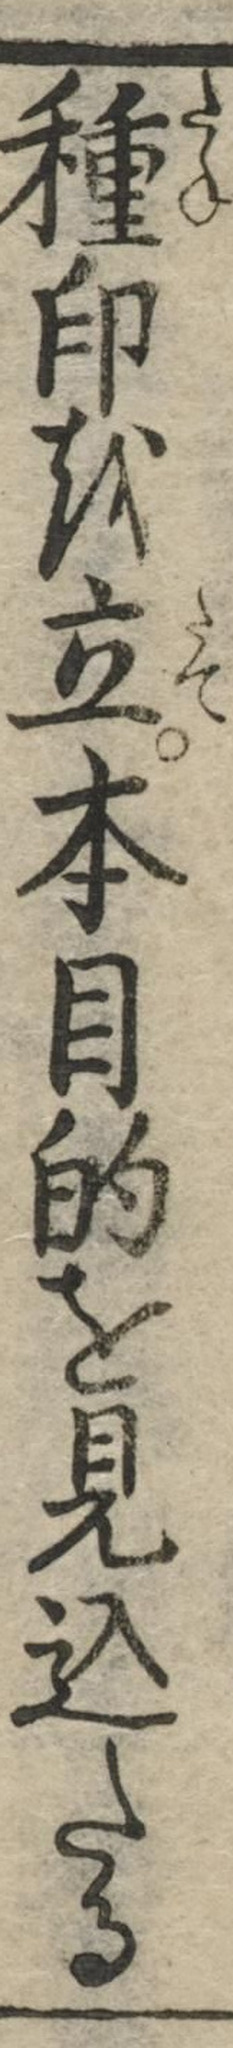種印を立。本目的を見込たる
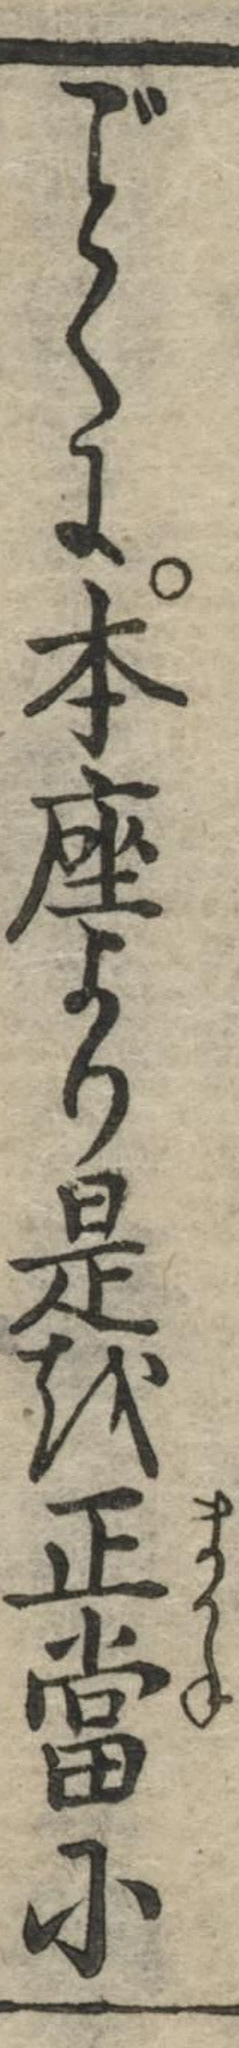ごとくに。本座より是を正當に
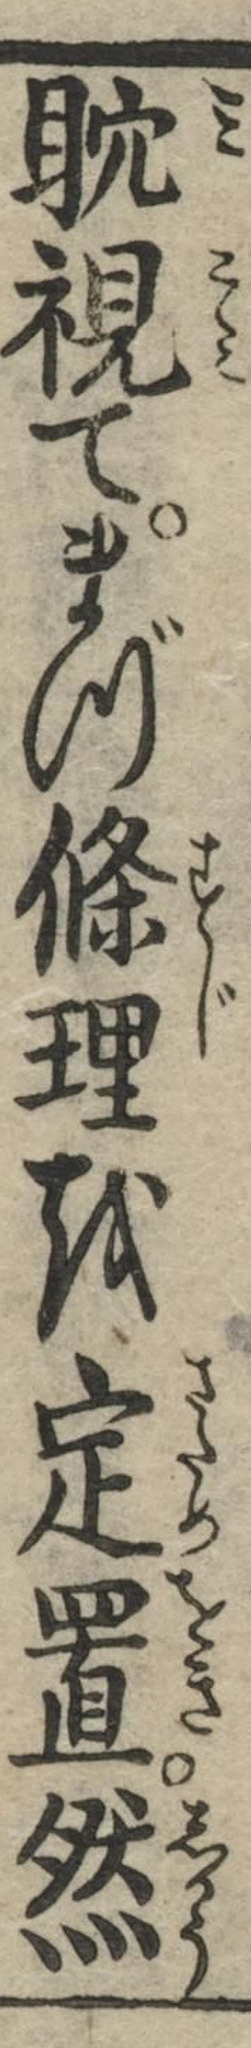眈視て。まづ條理を定置。然
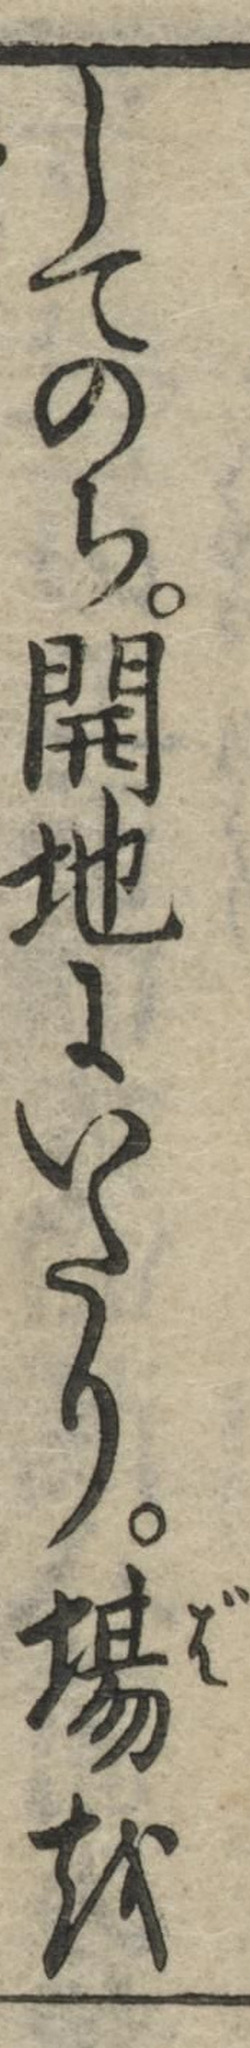してのち。開地にいたり。場を
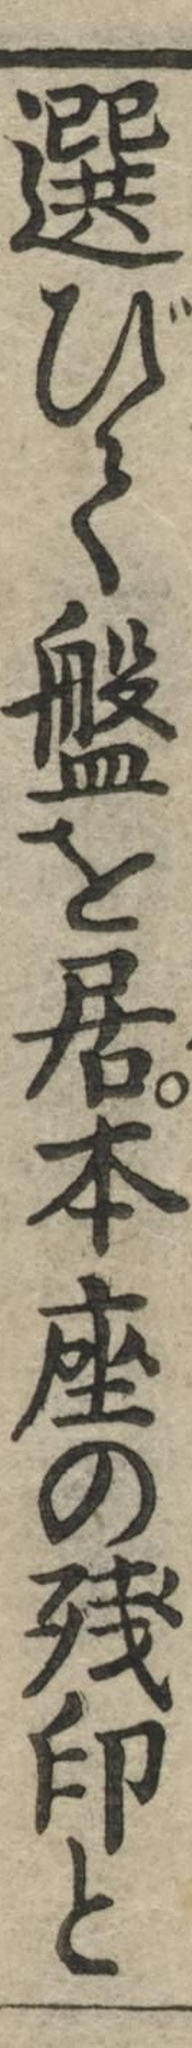選びて盤を居。本座の残印と
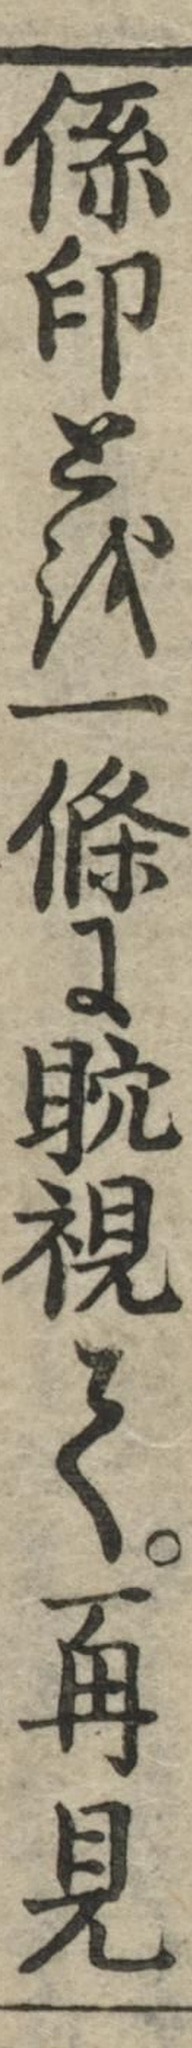係印とを一條に眈視て。再見
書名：量地指南　巻之一（内題）
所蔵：東京大学地震研究所図書室 Earthquake Research Institute Library, The University of Tokyo, JAPAN
